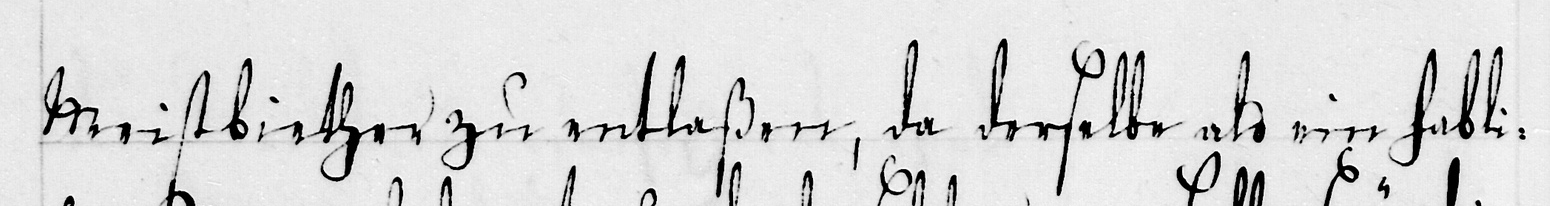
Meistbiether zu entlaßen, da derselbe als ein habli¬
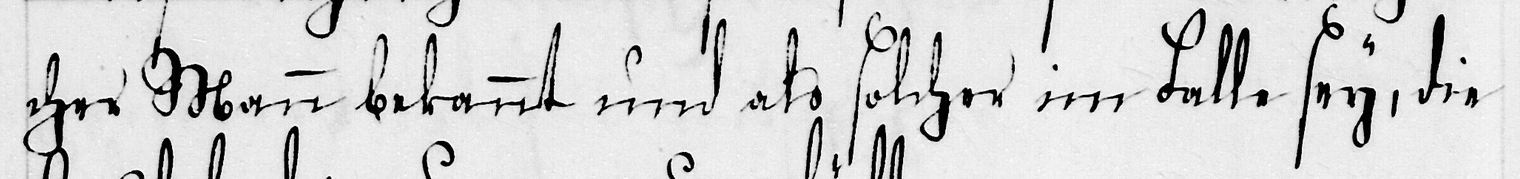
cher Mann bekannt und als solcher im Falle sey, die
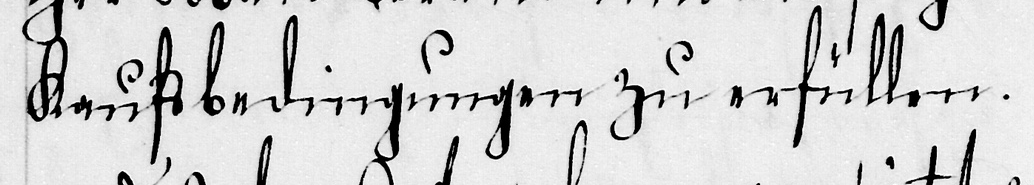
Kaufsbedingungen zu erfüllen.
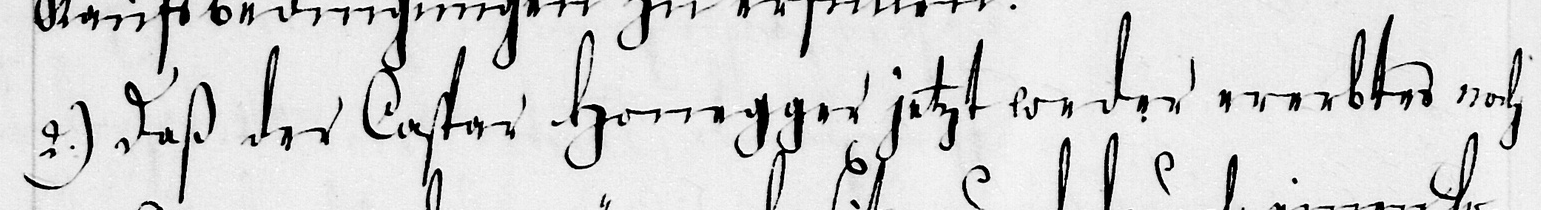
2.) Daß der Caspar Honegger jetzt weder ererbtes noch
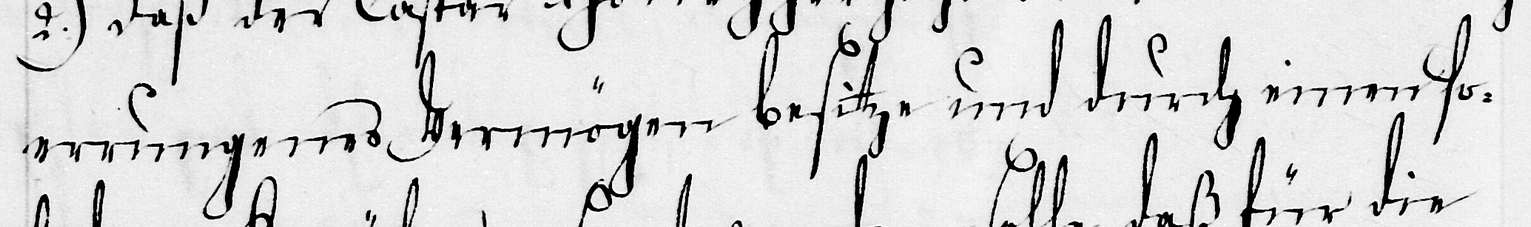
errungenes Vermögen besitze und durch einen so¬
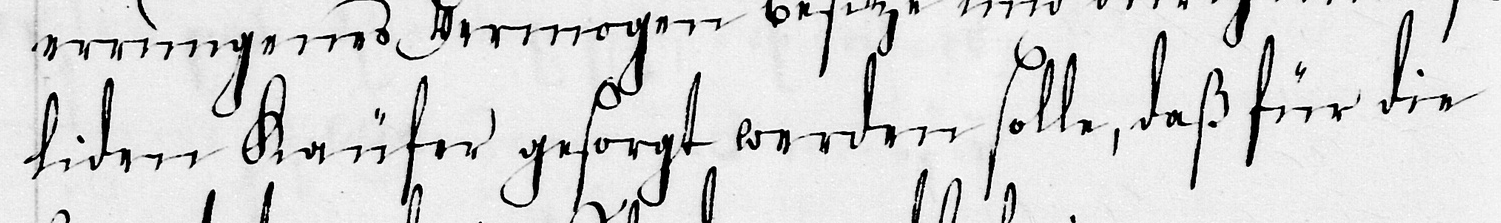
liden Käufer gesorgt werden solle, daß für die
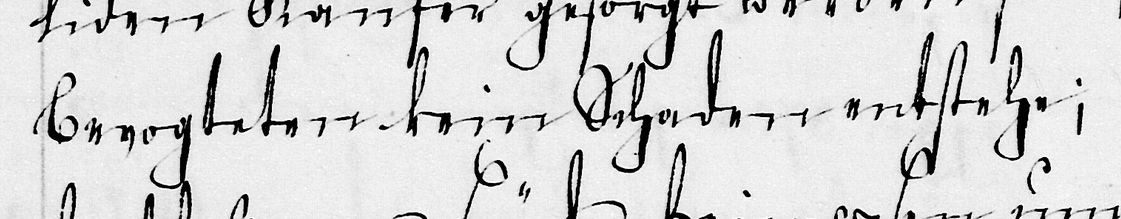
Bevogteten kein Schaden entstehe;
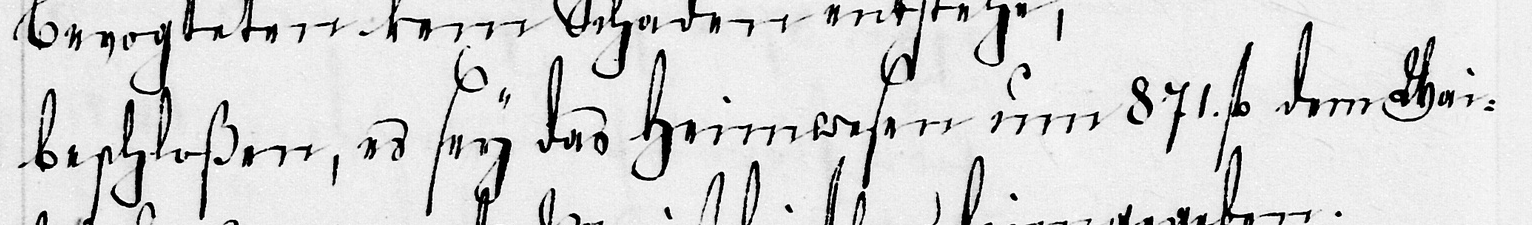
beschloßen, es sey das Heimwesen um 871. fl. dem Wai¬
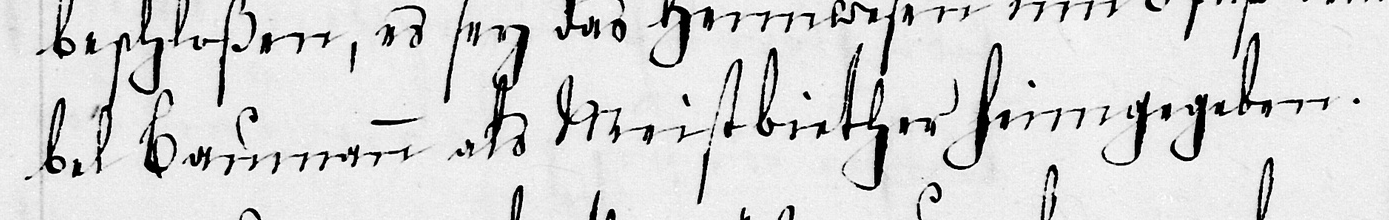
bel Baumann als Meistbiether heimgegeben.
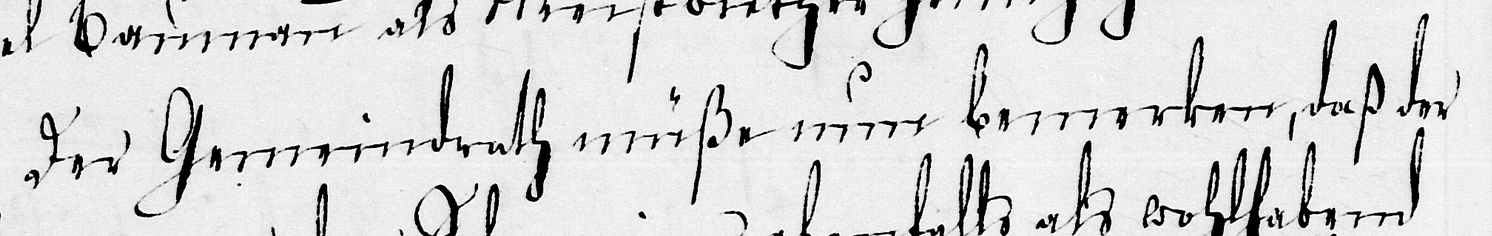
Der Gemeindrath müße nun bemerken, daß der
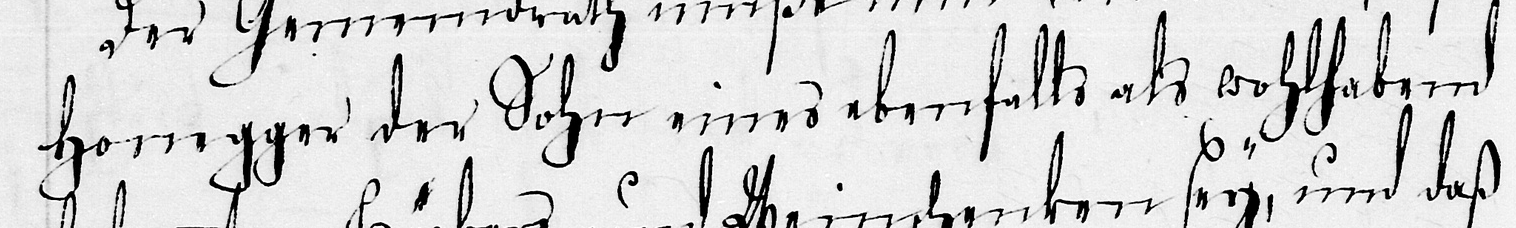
Honegger der Sohn eines ebenfalls als wohlhabend
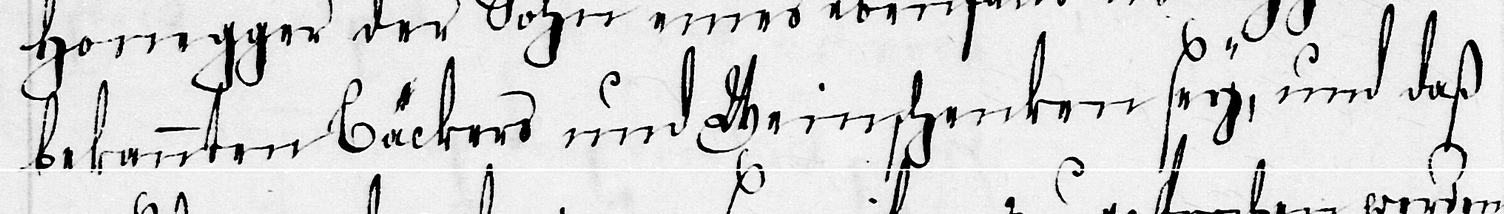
bekannten Bäckers und Weinschenken sey, und daß
